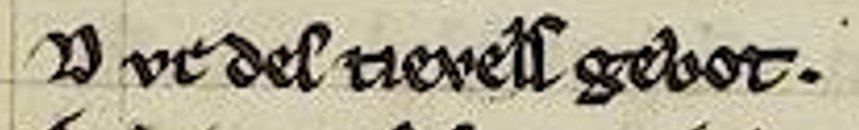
Dvr deſ tievelſ gebot.
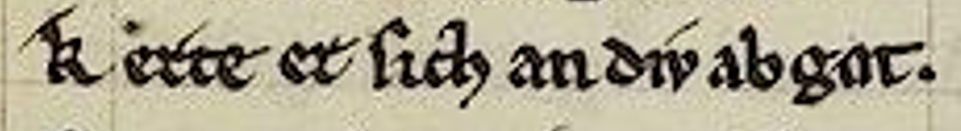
Kerte er ſich an div abgot.
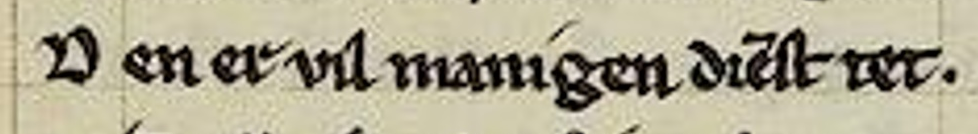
Den er vil manigen die(n)ſt tet.
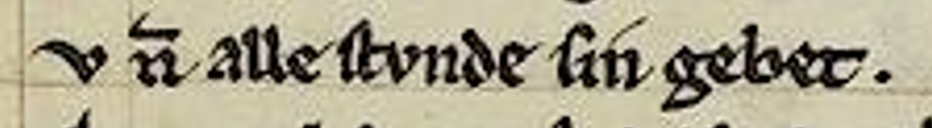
Vn(d) alle ſtvnde ſin gebet.
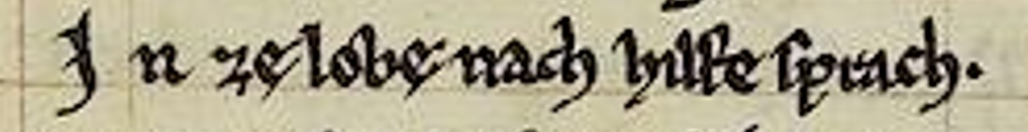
In ze lobe nach hilfe ſprach.
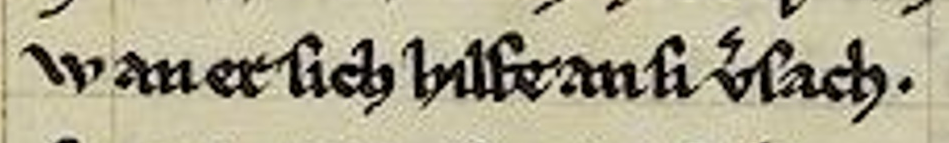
Wan er ſich hilfe an ſi v(er)ſach.
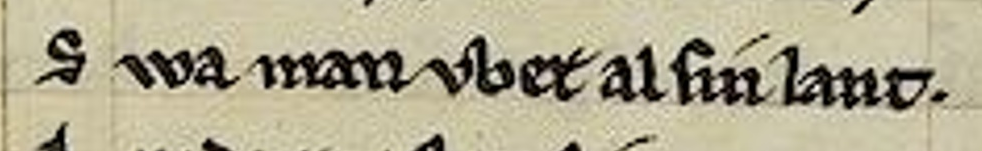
Swa man vber al ſin lant.
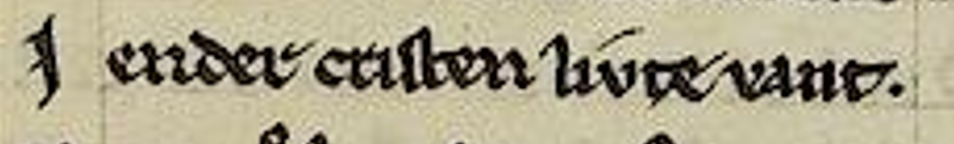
Iender criſten livte vant.
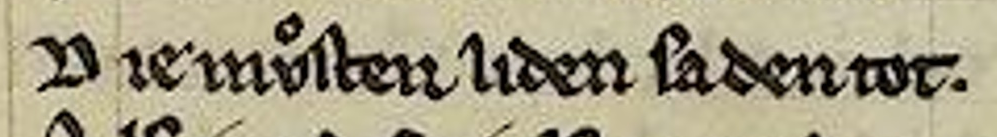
Die mv°oſten liden ſa den tot.
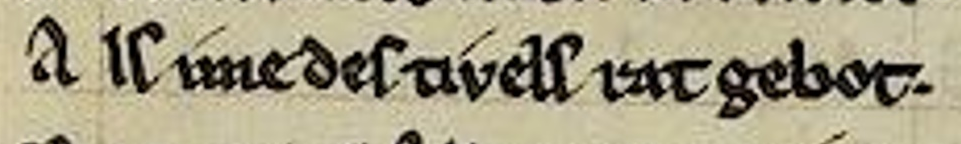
Alſ ime deſ tiuvelſ rat gebot.
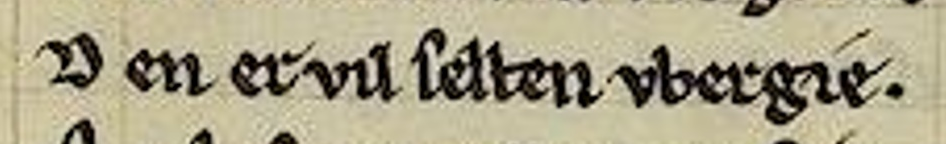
Den er vil ſelten vbergie.
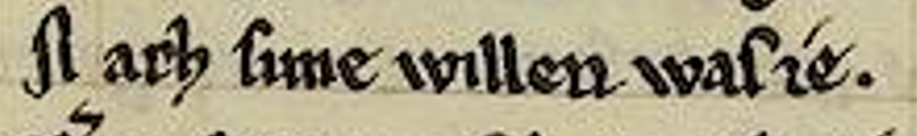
Nach ſime willen waſ ie.
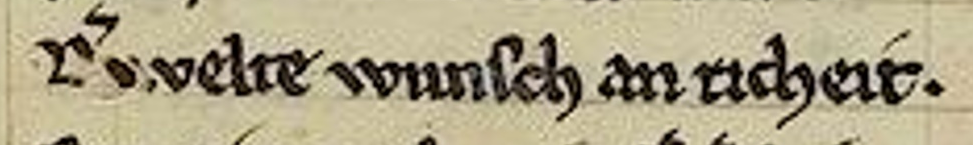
D(er) welte wunſch an richeit.
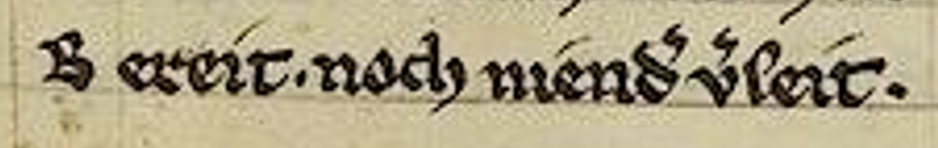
Bereit. noch niend(er) v(er)ſeit.
